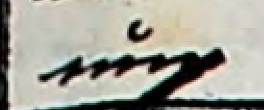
ung
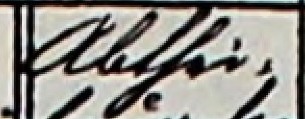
Abthei„
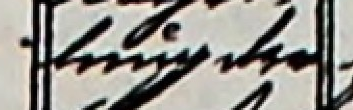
lung der
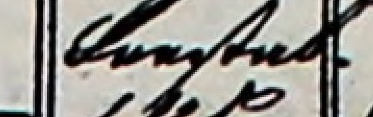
Fanstab„
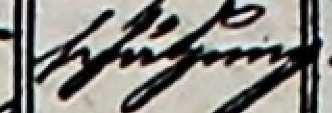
schätzung
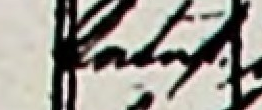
Katast.
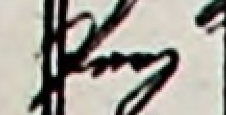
Parz
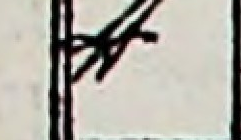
Hn
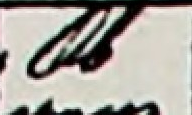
Ob
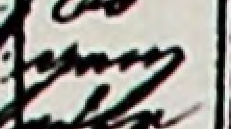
ganz
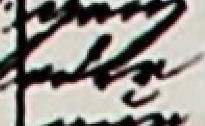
oder
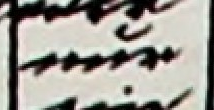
nur
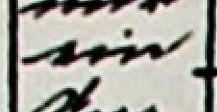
ein
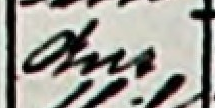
Ant
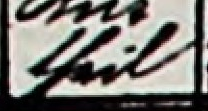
heil
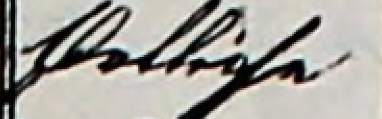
Örtliche
